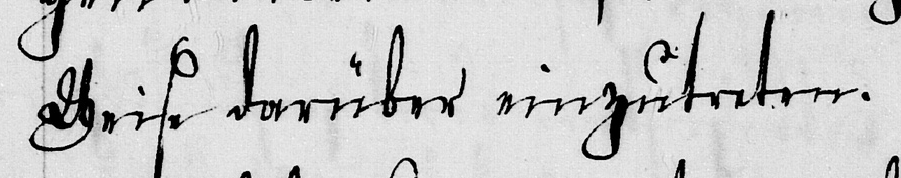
Weise darüber einzutreten.
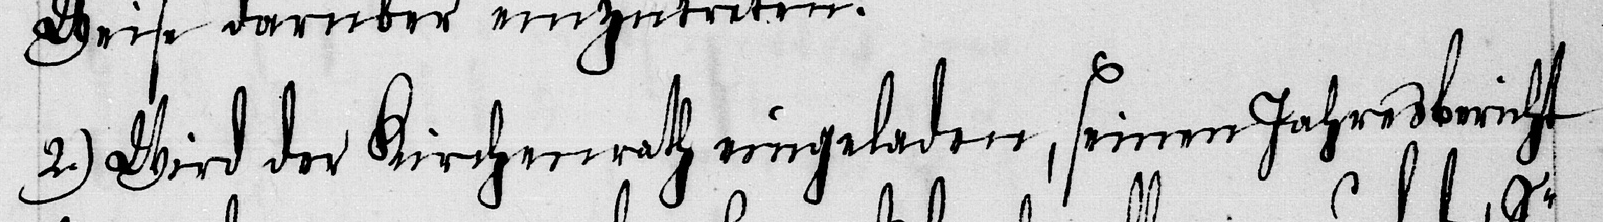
2.) Wird der Kirchenrath eingeladen, seinem Jahresbericht
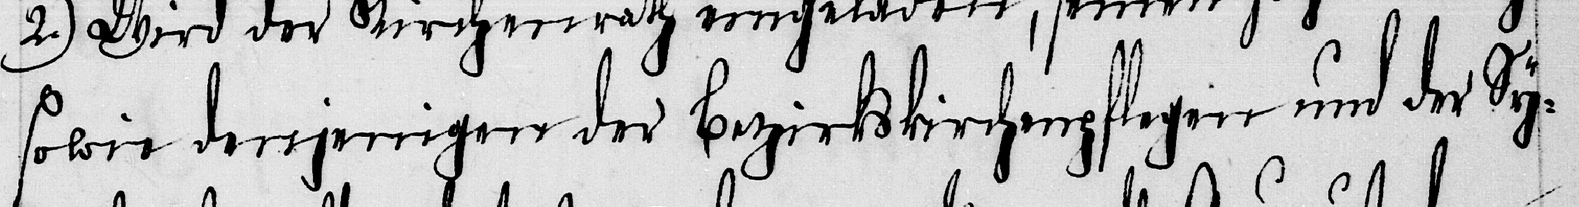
sowie denjenigen der Bezirkskirchenpflegen und der Sy¬
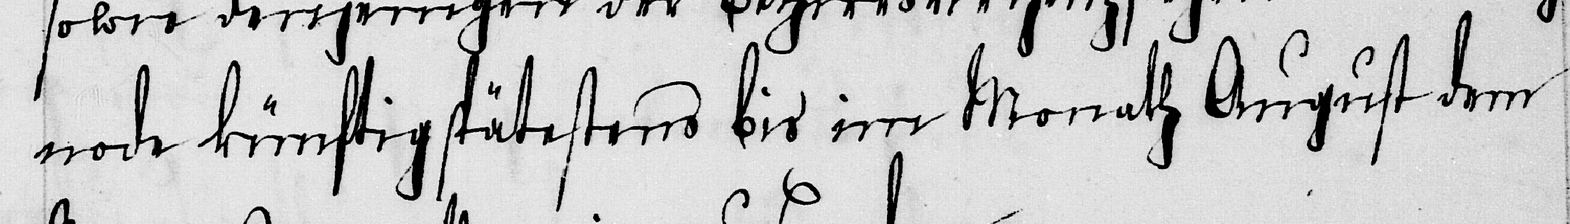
node künftig spätestens bis im Monath August dem
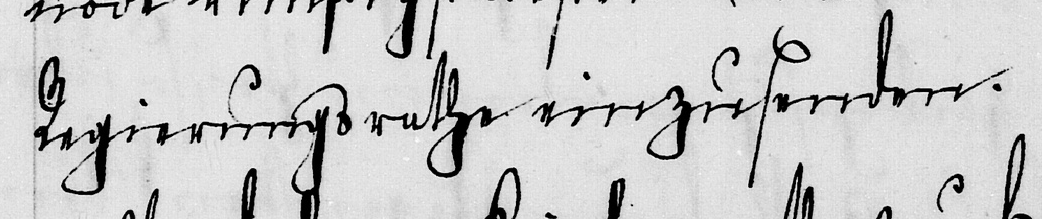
Regierungsrathe einzusenden.
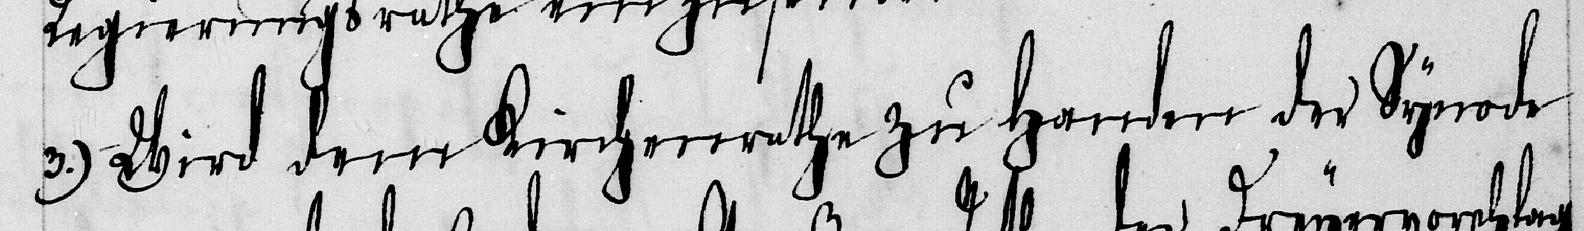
3.) Wird dem Kirchenrathe zu Handen der Synode
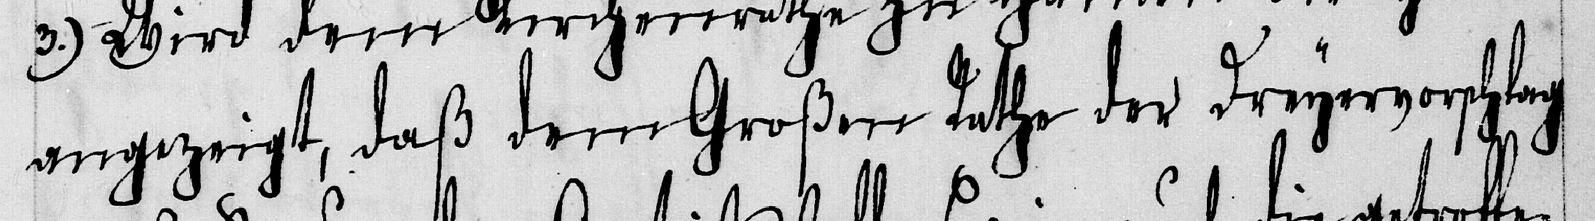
angezeigt, daß dem Großen Rathe der Dreyervorschlag
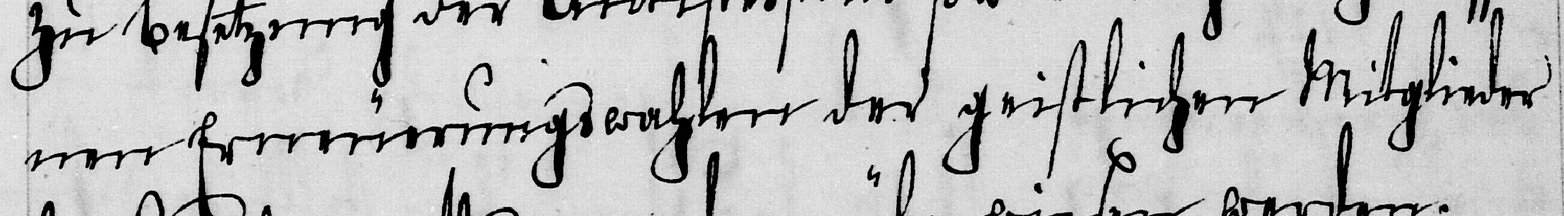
enen Erneuerungswahlen der geistlichen Mitglieder
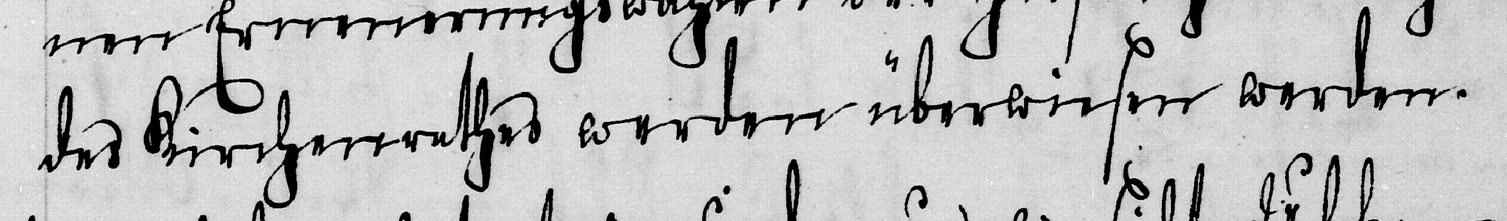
des Kirchenrathes werden überwiesen werden.
